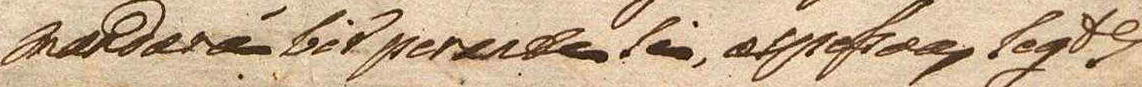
mandará vir perante si, as pessoas segtes
